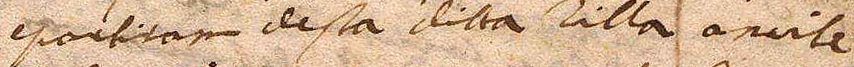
e partiram desta ditta villa a noite
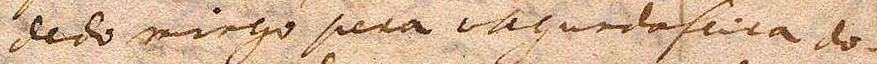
de domingo pera a segunda feira do
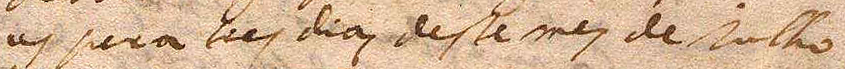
us pera tres dias deste mes de Iulho
